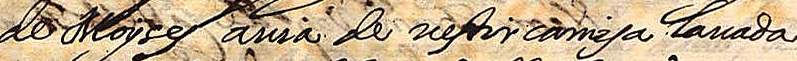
de Moyses auia de uestir camisa lauada
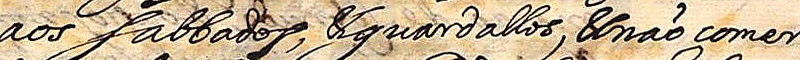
aos sabbados, & guardallos, & naõ comer
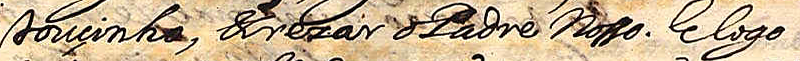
touçinho, & rezar o Padre Nosso. E logo
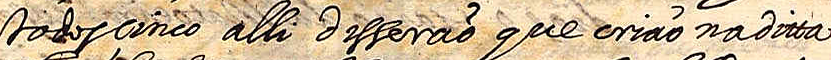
todos çinco alli disseraõ que criaõ na ditta
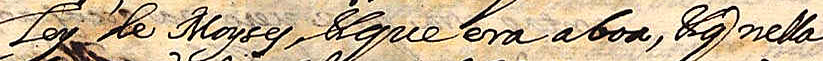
Ley de Moyses, & que era a boa, & que nella
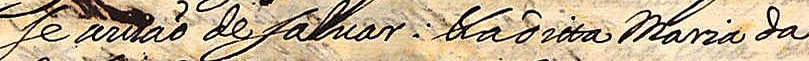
se auiaõ de saluar : & a ditta Maria da
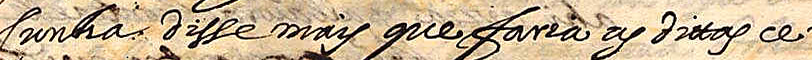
Cunha disse mais que faria as dittas ce
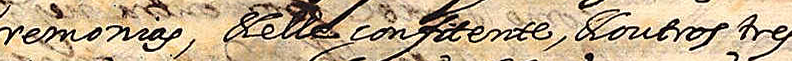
remonias, & elle confitente, & outros tres
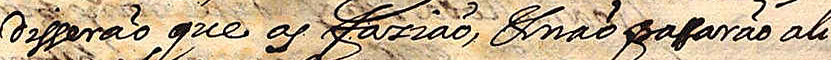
disseraõ que as fariaõ, & naõ passarão ali
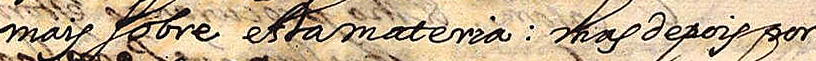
mais sobre esta materia : mas depois por
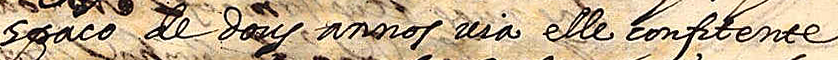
spaco de dous annos uia elle confitente
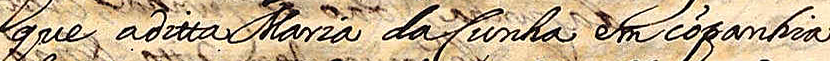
que a ditta Maria da Cunha em cōpanhia
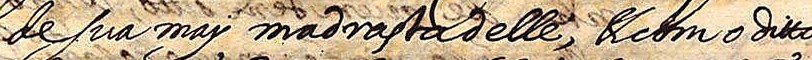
de sua may madrasta delle, & com o ditto
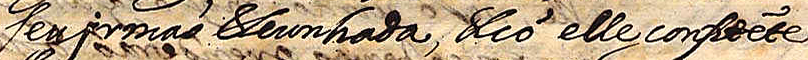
seu jrmaõ & cunhada, & cō elle confitēte
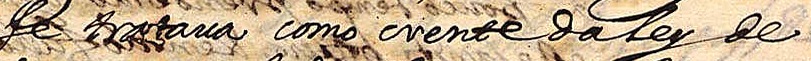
se trataua como crente da Ley de
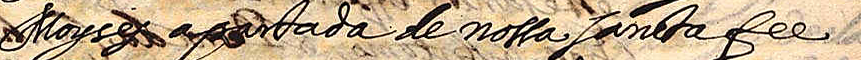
Moyses apartada de nossa sancta fee
